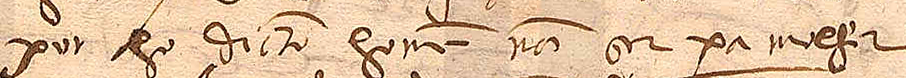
por ho dic̄to homē nā ser ꝑa molher
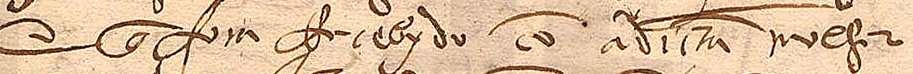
e q̄ fora Recebydo cō a dic̄ta molher
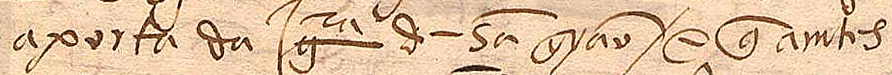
a porta da Jgra de sā gyão / e q̄ amtes
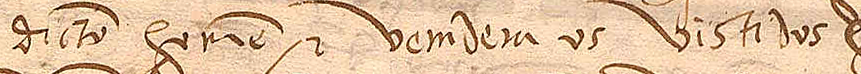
dīcto homē e vemdera os vistidos ha
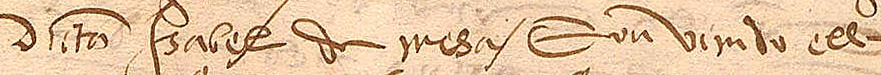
dīcta Jsabel de mesa / E ouvimdo elle
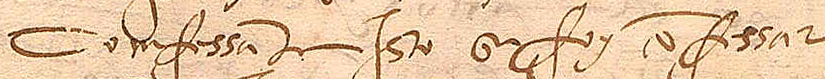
Comfessāte Jsto se foy cōfessar
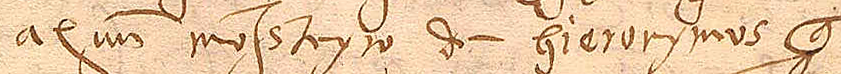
a hūu moJsteyro de hieronymos q̄
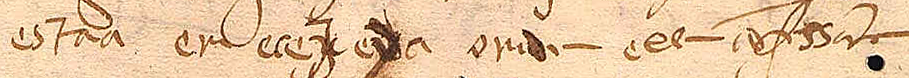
estaa em ell_e_a omde elle cōfessāte
